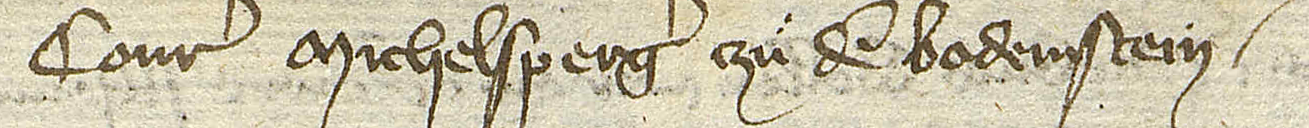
Conr* Michelſperg* cʒu d* bodemſtein /
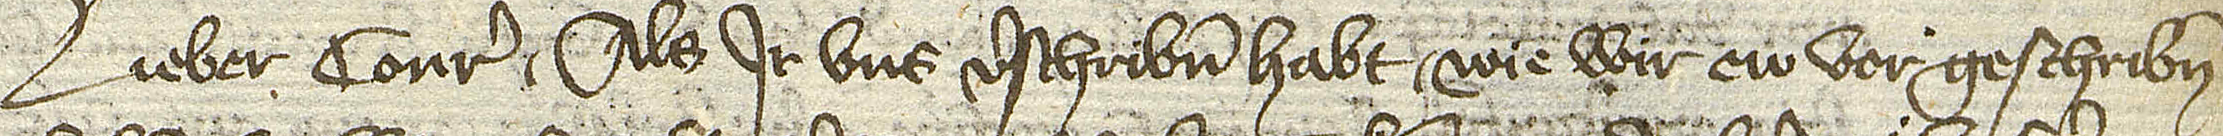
Lieber Conr* / Als Ir vns v*ſchribn* habt / wie wir ew vor geſchribn*
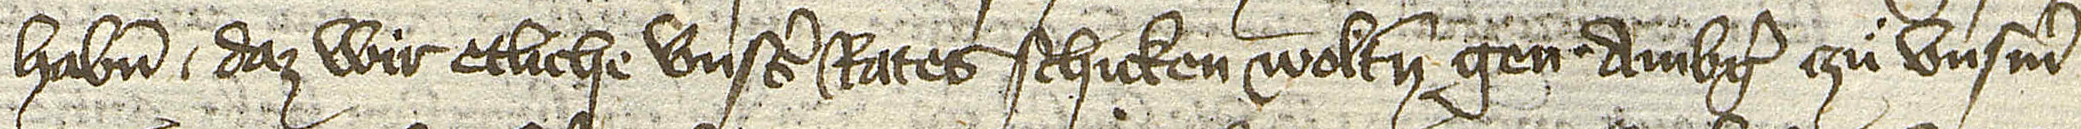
habn* / daʒ wir etliche vnſs* Rates ſchicken woltn* gen ~ Ambg* cʒü vnſm*
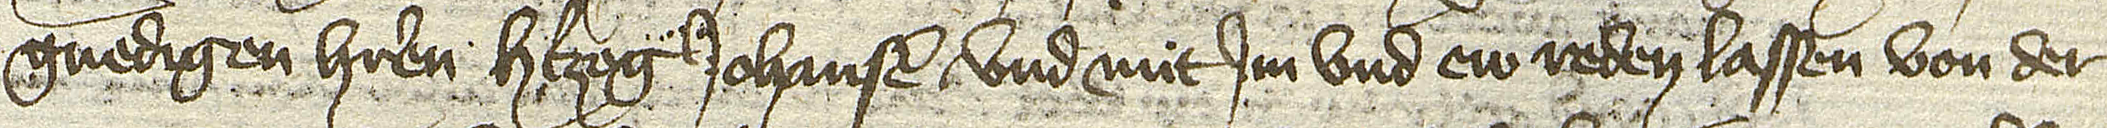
gnedigen hr*en h*cʒog Iohanſe* vnd mit Im vnd ew reden laſſen von der
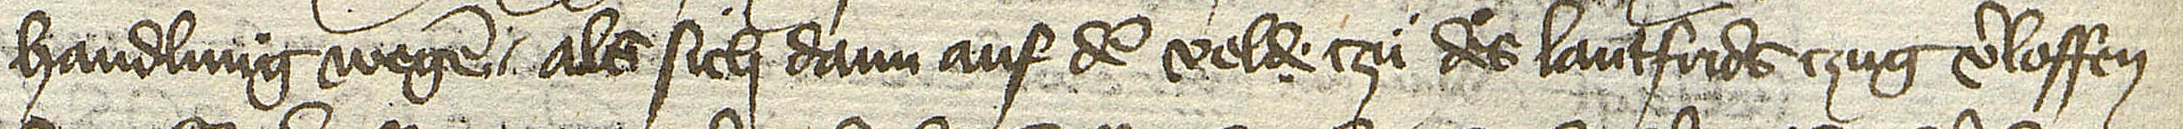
handlung wege* / als ſich dann auf d* velde cʒü des lantfrids cʒug v*loffen
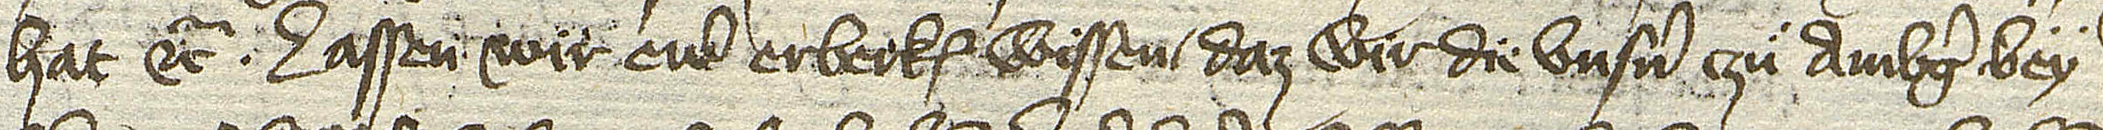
hat ec* . Laſſen wir ew* erberk* wiſſen / daʒ wir die vnſn* cʒü Ambg* bey
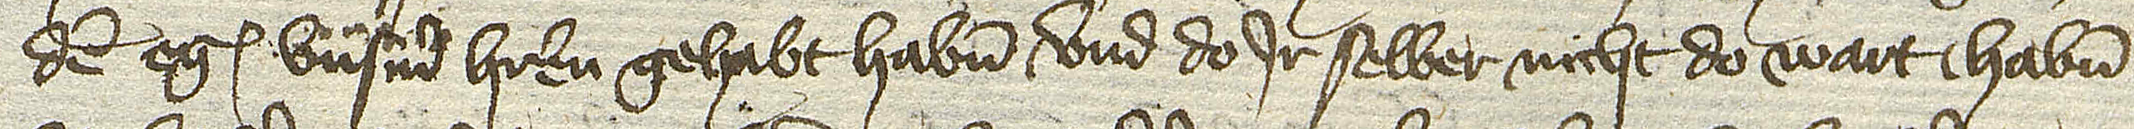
d* eg* vnſm* hr*en gehabt habn* / vnd do Ir ſelber nicht do wart / habn*
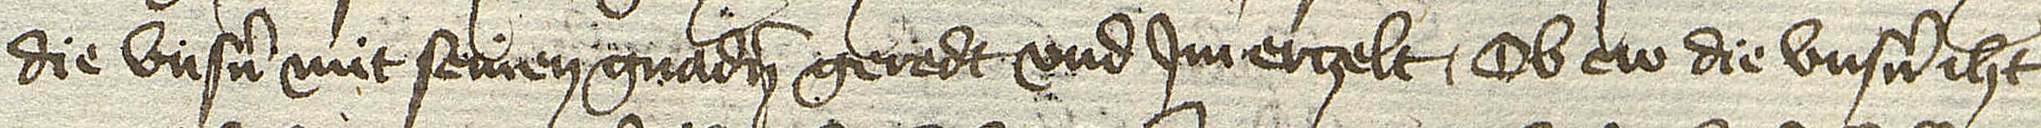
die vnſn* mit ſeinen gnadn* geredt vnd Im ercʒelt / Ob ew die vnſn* iht
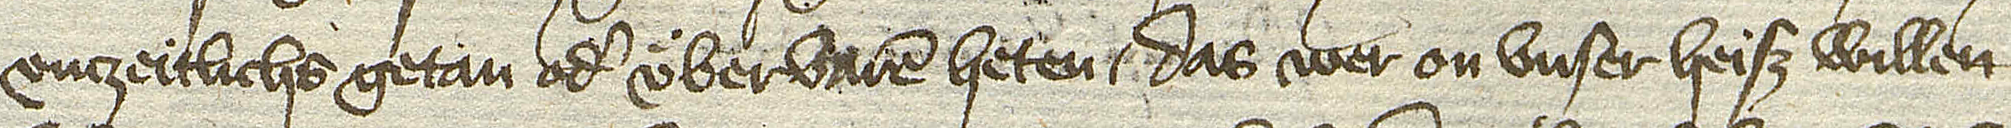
vncʒeitlichs getan od* v̈bervare* heten / das wer on vnſer heiſʒ willen
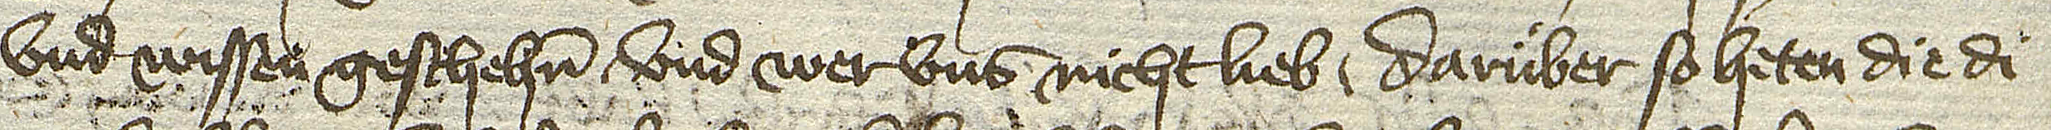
vnd wiſſen geſchehn* / vnd wer vns nicht lieb / Darüber ſo heten die di
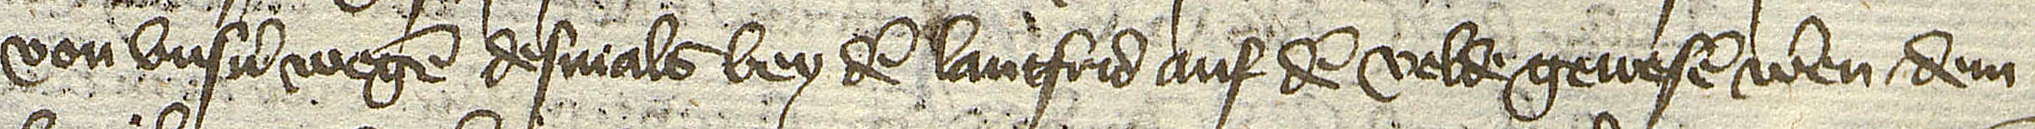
von vnſn* wege* deſmals bey d* lantfrid auf d* velde geweſe* w*en / dem
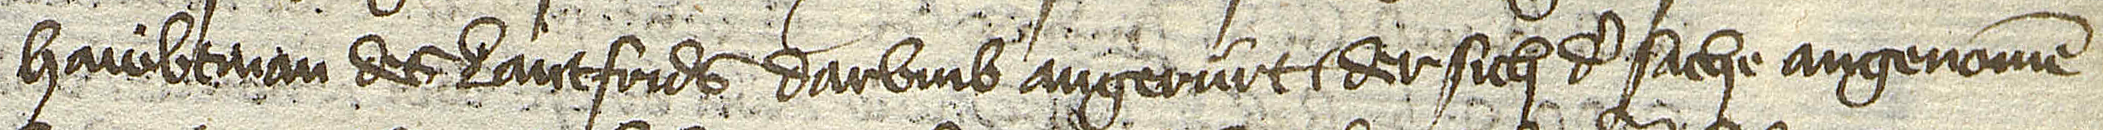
hawbtman des Lantfrids darvmb angerürt / der ſich d* ſache angenome*
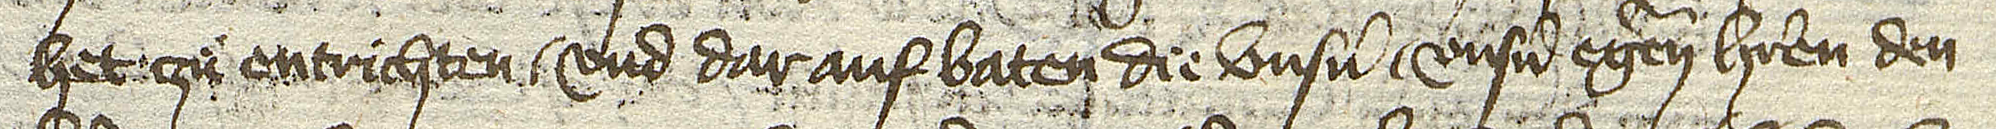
het cʒü entrichten / vnd dar auf baten die vnſn* / vnſn* egen* hr*en den
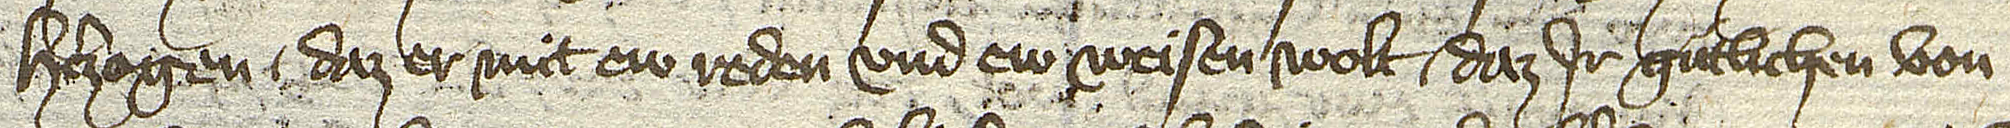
h*cʒogen / daʒ er mit ew reden vnd ew weiſen wolt / daʒ Ir gütlichen von
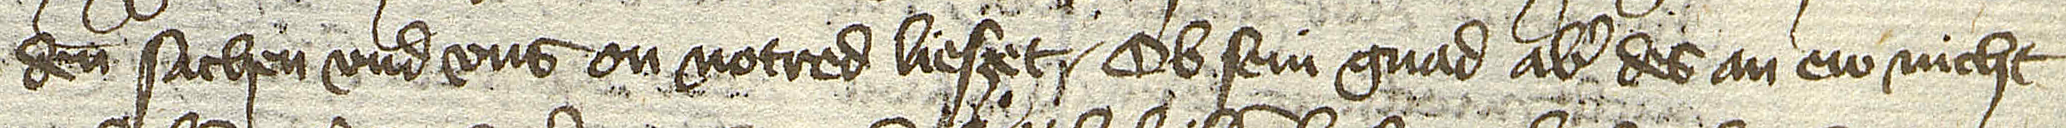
den ſachen vnd vns on notred lieſʒet / On ſein gnad ab* des an ew nicht
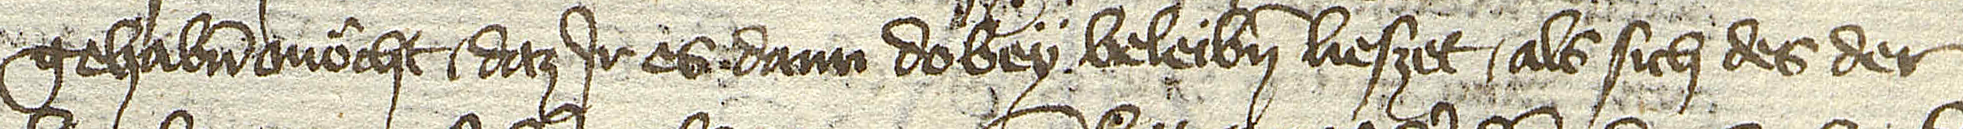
gehabn* möcht / daʒ es dann dobey beleibn* lieſʒet / als ſich des der
